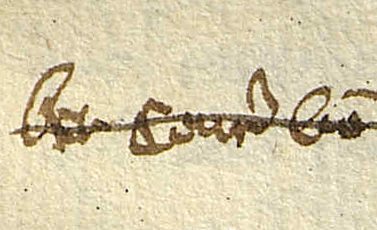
her Conr* vo*
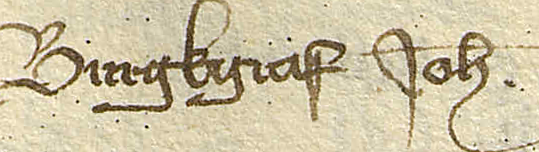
Burgkgraf Ioh* .
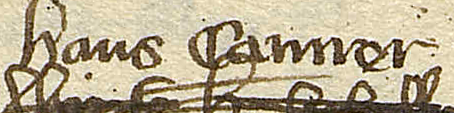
hans Camrer
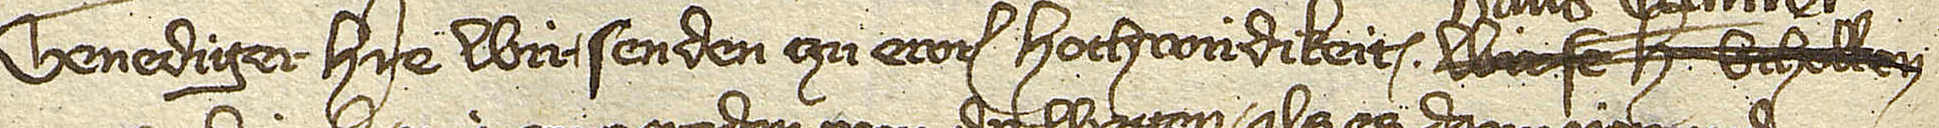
Gnediger h*re Wir ſenden cʒu ewr* hochwirdikeit / . Wir ſe h Schollen
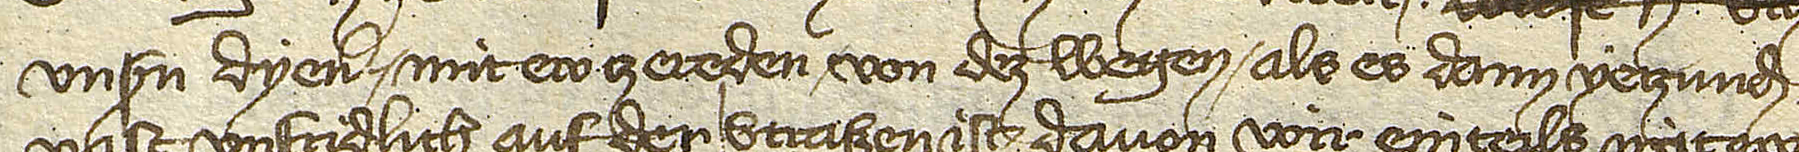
vnſ*n dyen* - / mit ew cʒereden / von deʒ wegen / als es dann yecʒund*
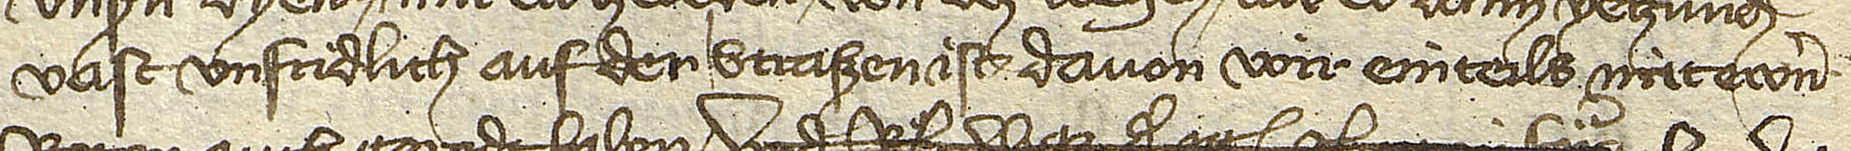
vaſt vnfridlich auf der Straſʒen iſt / dauon wir einteils mit ewn*
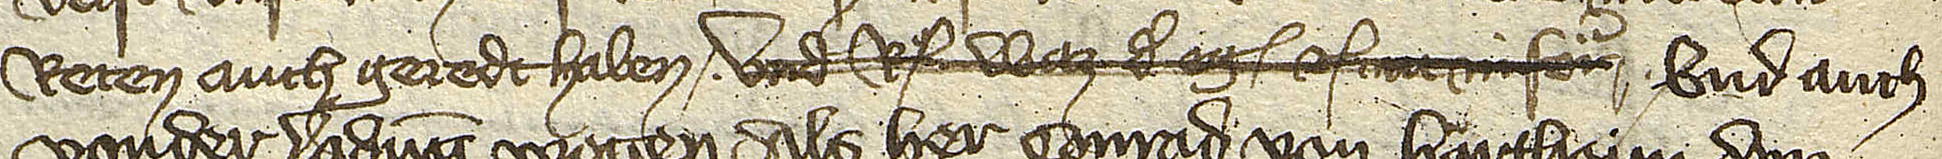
Reten auch geredt haben / . Vnd R* waʒ d* eg* ec* ut in for* / vnd auch
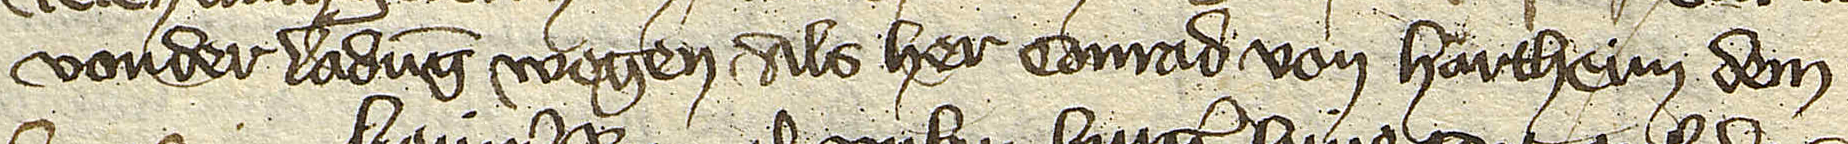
von der ladug* wegen / Als her Conrad von hartheim dem
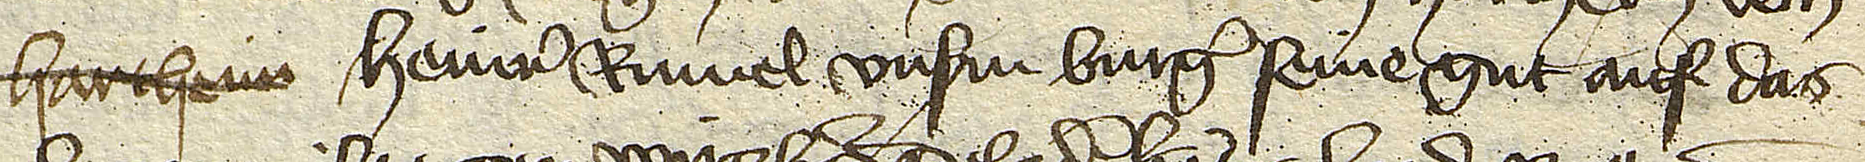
hartheim / heinr* Rumel vnſ*m burg* ſeine gut auf das
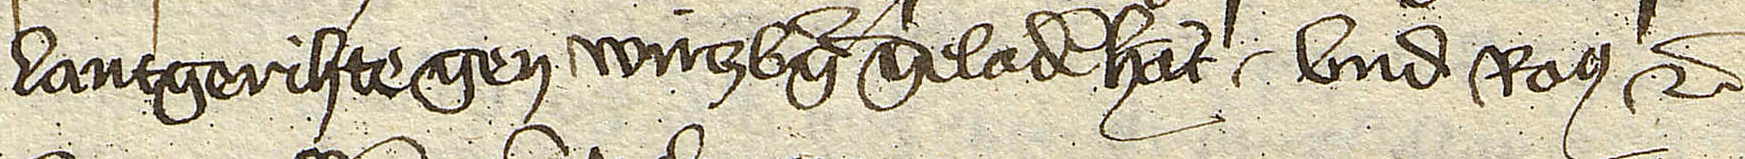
lantgerihte gen wircʒb*g gelad* hat / vnd Ro* ec*
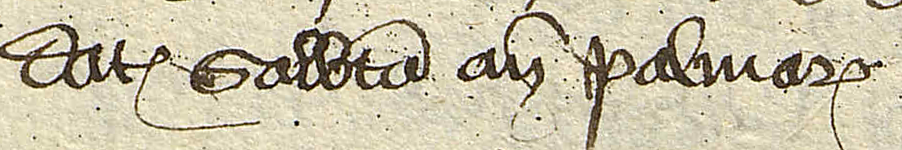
dat* Sabbto* an* Palma*
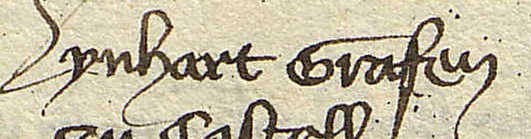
Lynhart Grafen
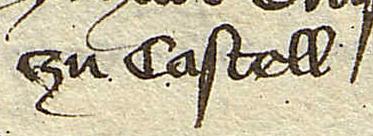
cʒu Caſtell
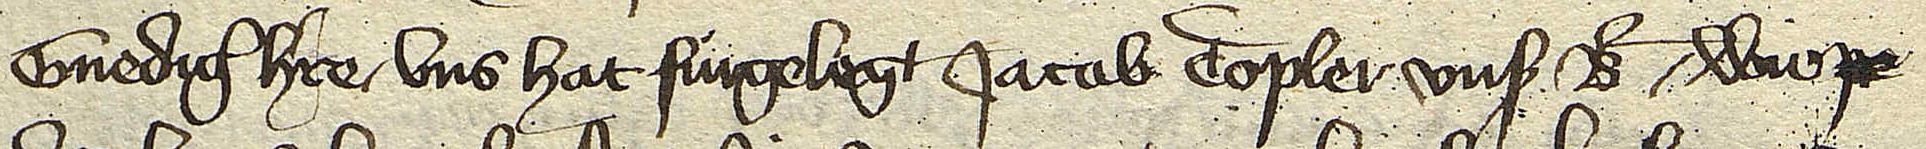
Gnedig* h*re / vns hat fürgelegt Iacob Topler vnſ* B* / wie Ir
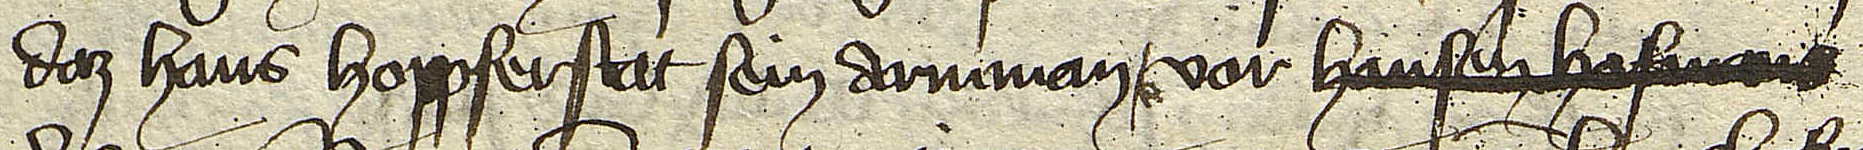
daʒ hans hopplerſtat ſein Armman / vor hanſen hofmans
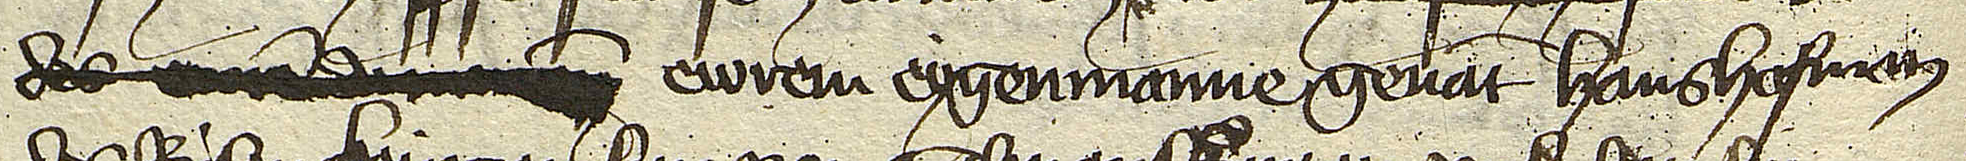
des ewn* Armman* ewren eygenmanne genat* hans hofman
